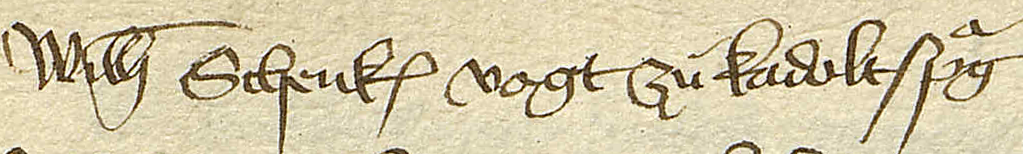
Wilh* Schenk* vogt cʒü Kadoltſp*g
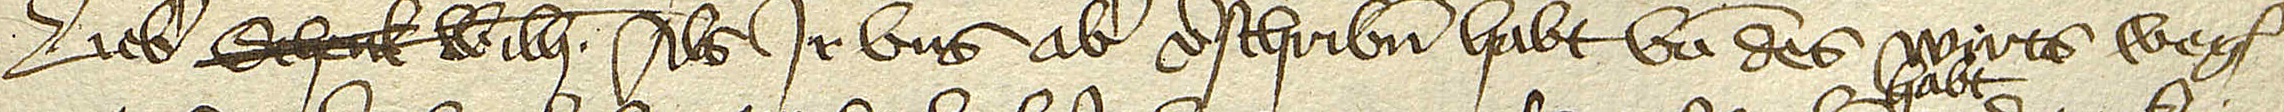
Lieb* Schenk wilh* . Als Ir vns ab* v*ſchribn* habt vo* des wirts weg*
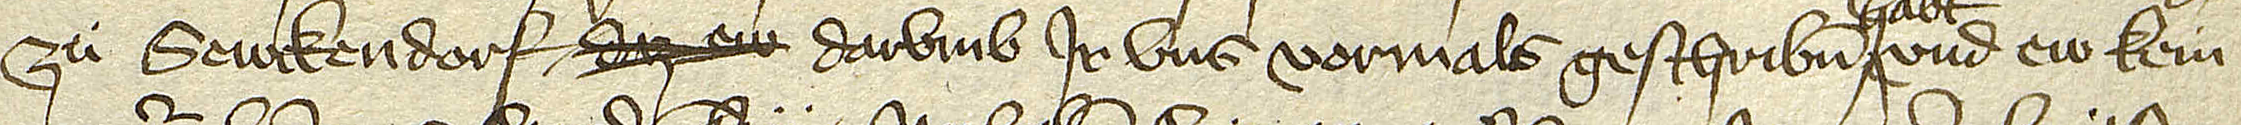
cʒü Sewckendorf / daʒ ew darvmb Ir vns vormals geſchribn* vnd ew kein
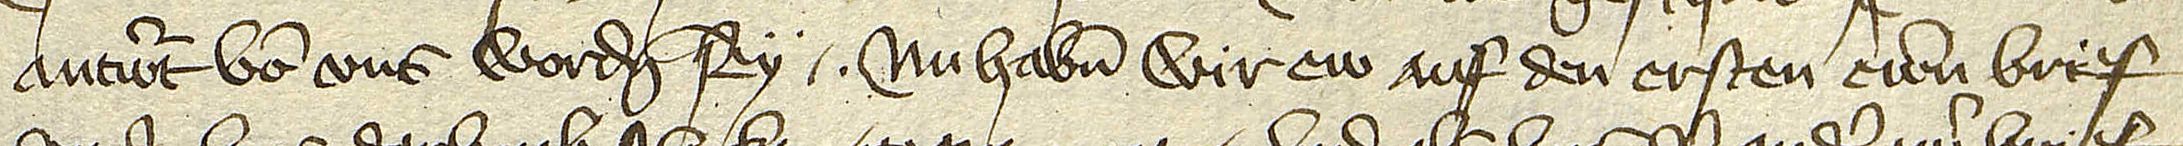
antw*t vo* vns wordn* ſey / . Nu habn* wir ew auf den erſten ew*n brief
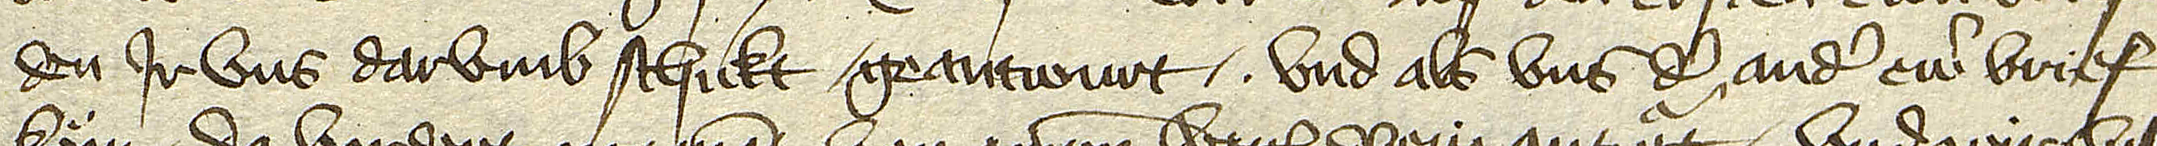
den Ir vns darvmb ſchickt / geantwurt / . vnd als vns d* and* ew* brief
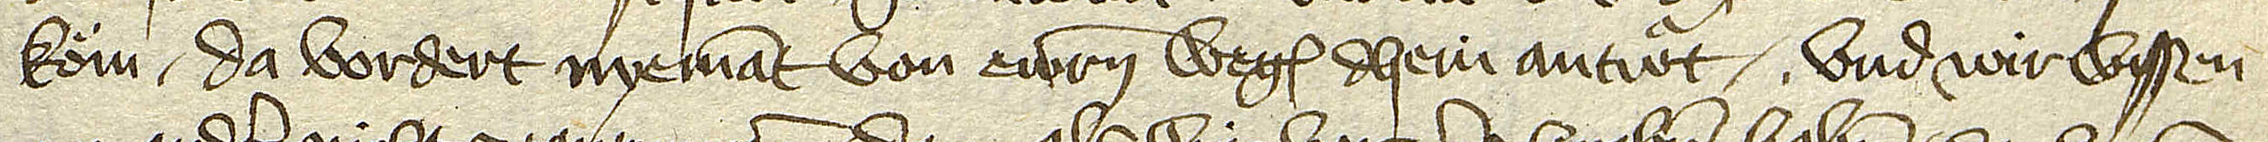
köm / da vordert nyemat* von ewrn* weg* dhein antw*t / . vnd wir wiſſen
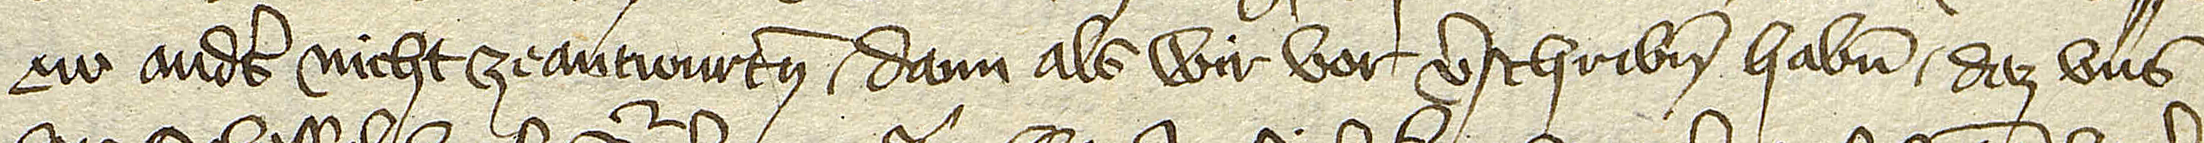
ew ands* nicht cʒeantwurtn* / dann als wir vor v*ſchribn* habn* / daʒ vns
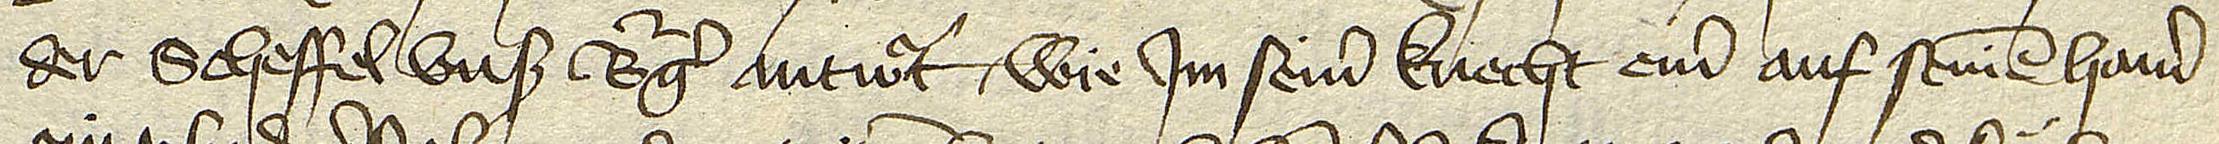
der Scheffel vnſ* B*g* antw*t / wie Im ſein* knecht ein* auf ſeine* ham*
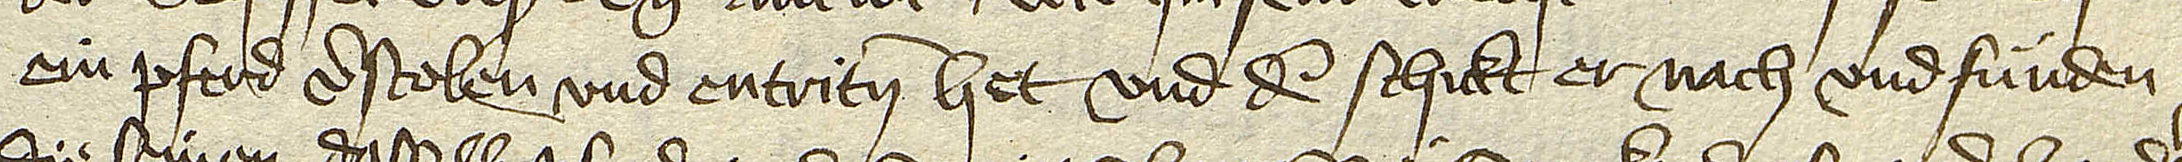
ein pferd v*ſtolen vnd entritn* het vnd d* ſchickt er nach vnd fünden
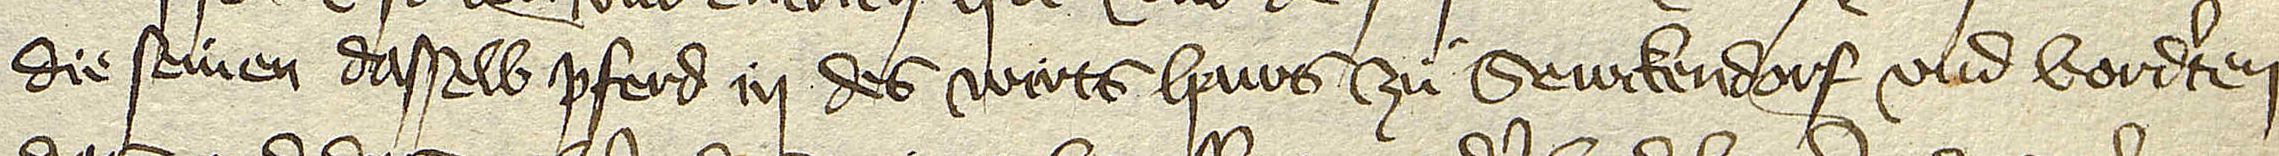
die ſeinen daſſelb pferd in des wirts haws cʒü Sewckendorf vnd vord*ten
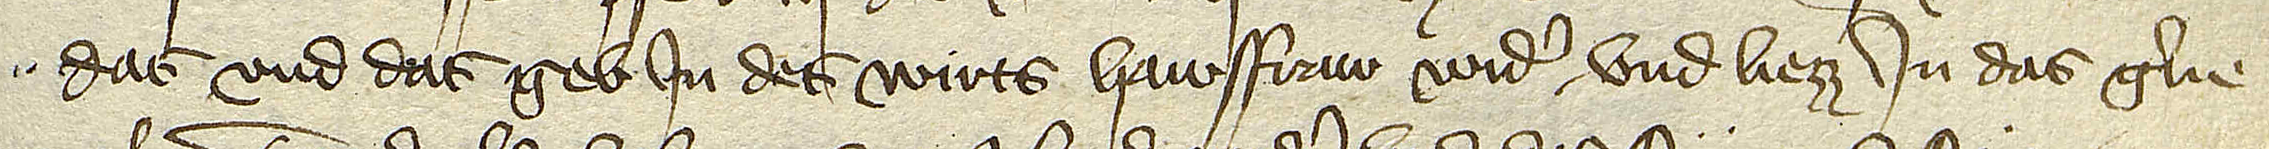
das vnd das geb In des wirts hawſfrau wid* / vnd lieʒʒ In das g*ne
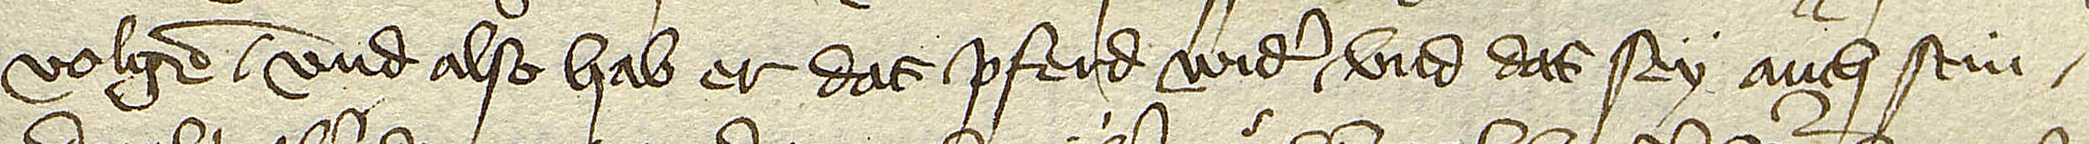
volge* / vnd alſo hab er das pferd wid* / vnd das ſey auch ſein /
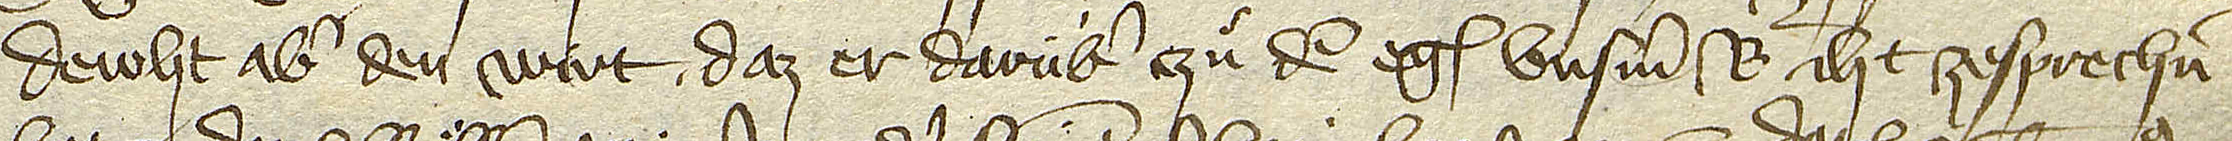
Dewht ab* den wirt . daʒ er darüb* cʒü d* eg* vnſm* B* iht cʒeſprechn*
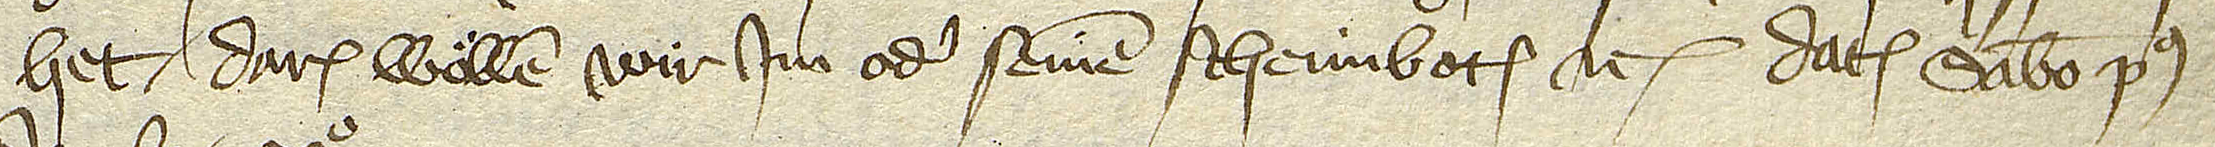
het / dar* wölle* wir Im od* ſeine* ſcheimbot* ec* dat* Sabo* p*
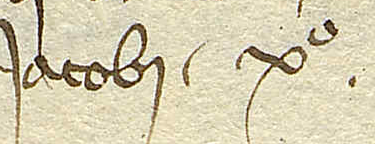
Iacobi / x* .
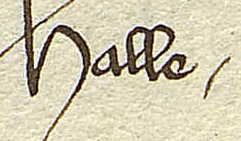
halle /
